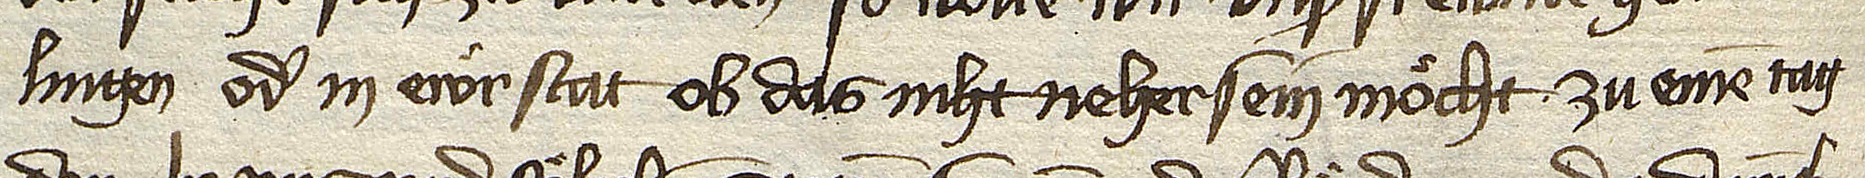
lingen od* in eẅr ſtat ob das niht neher ſein möcht . ʒu eine* tag
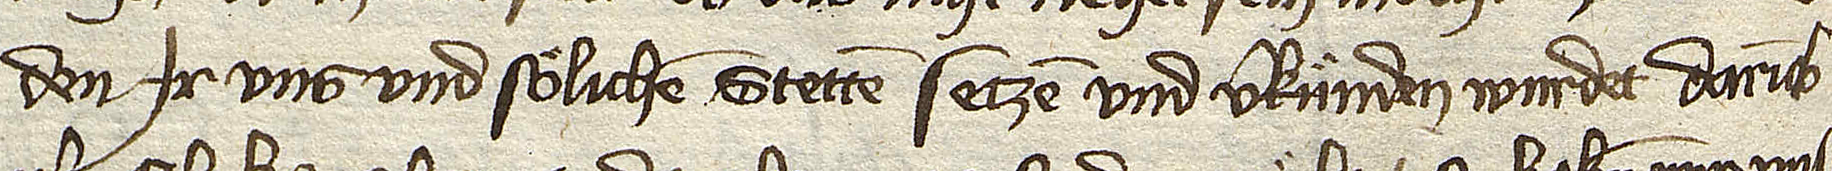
den Ir vns vnd ſöliche* Stette* ſecʒe* vnd v*künden wurdet darub*
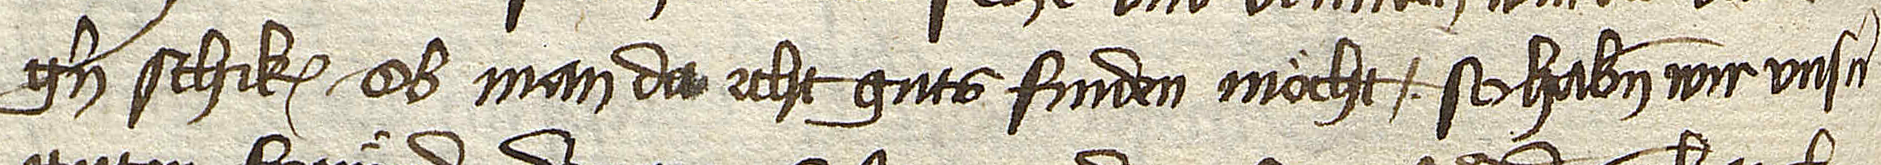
g*n ſchik* / Ob man da icht guts finden möcht / . ſo habn* wir vnſn*
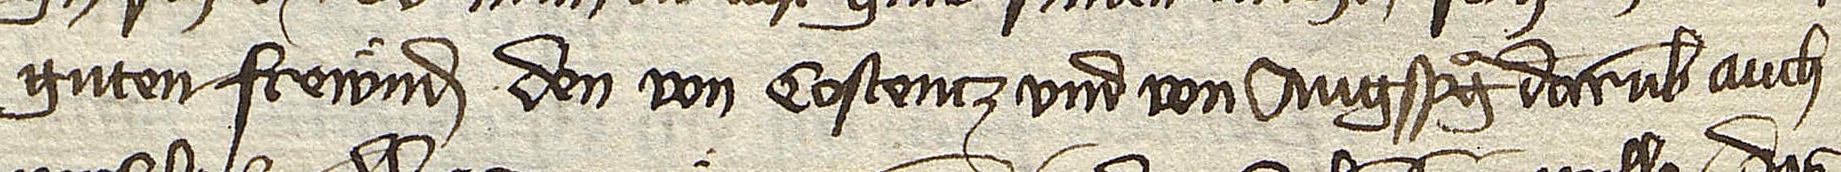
guten freẅnd* Den von Coſtencʒ vnd von Augſp*g darub* auch
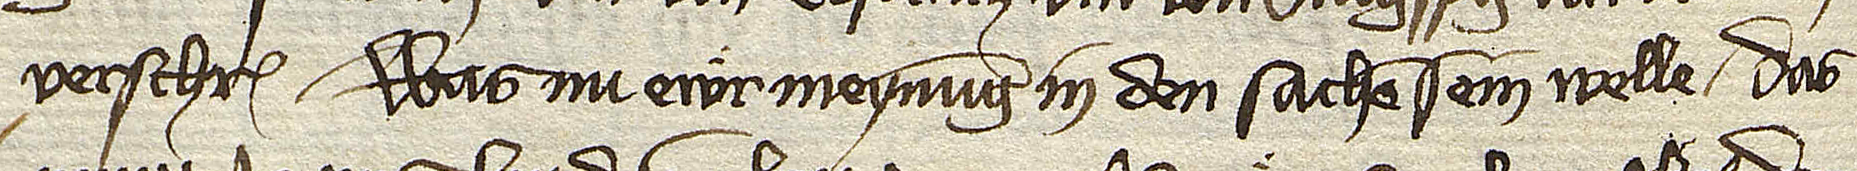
verſchr* / Was nu eẅr meynu*g in den ſache* ſein welle / das
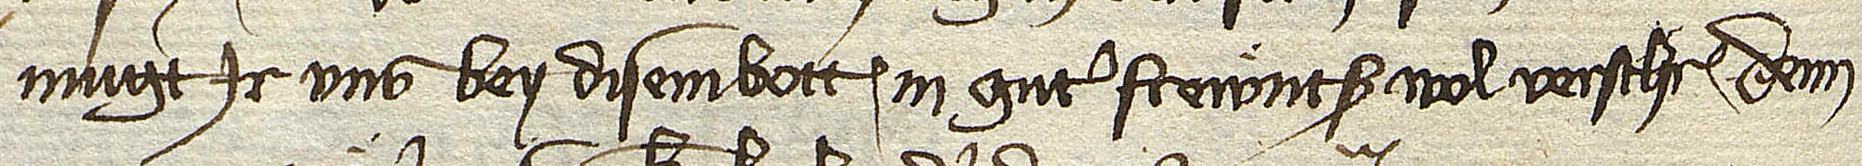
mugt Ir vns bey diſem bott* in gut* freẅntſ* wol verſchr* Denn
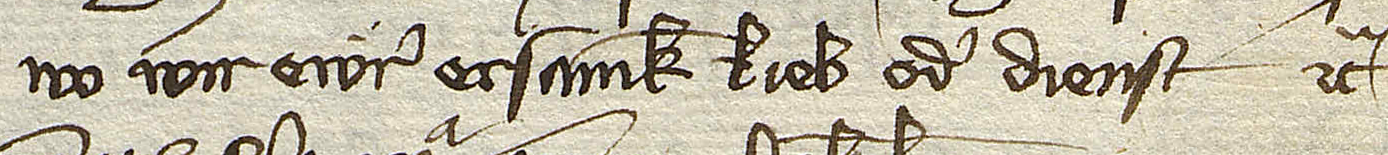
wo wir eẅr* erſamk* lieb od* dienſt ec*
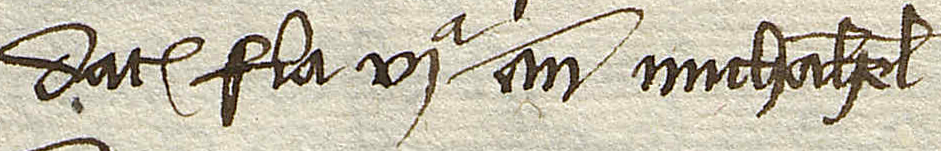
Dat* fi*a vi* an* michahel*
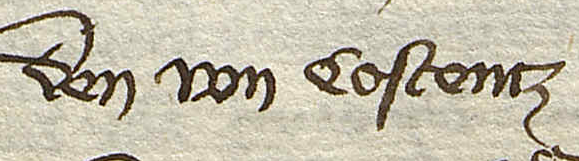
Den von Coſtencʒ
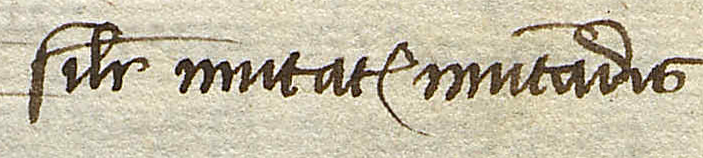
ſilr* mutat* muta*dis
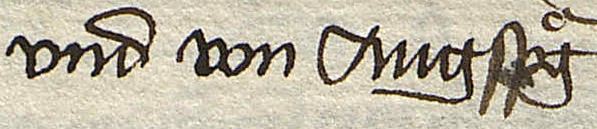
vnd von Augſp*g
